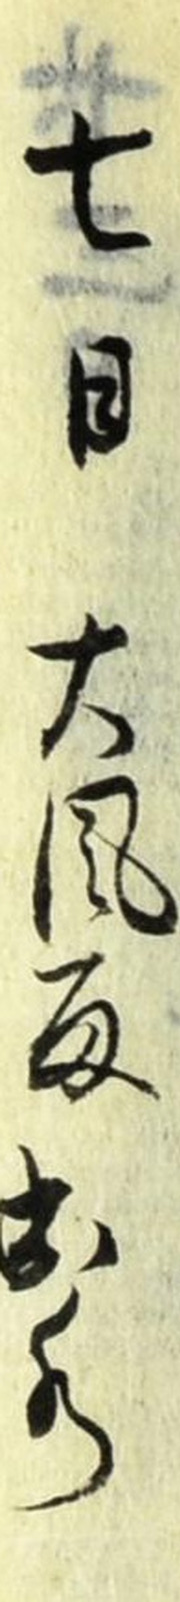七日大風雨出水
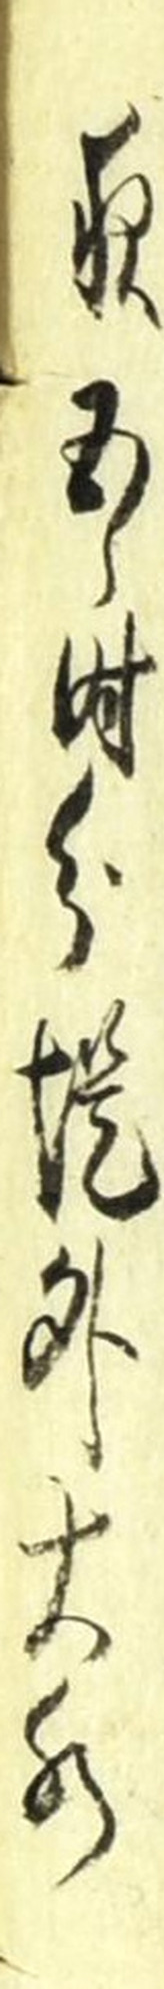夜五ツ時分堤外大水

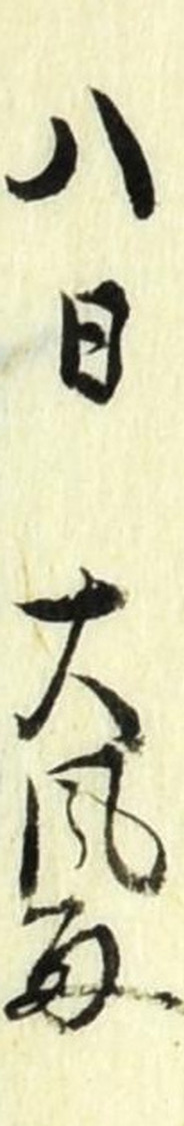八日大風雨
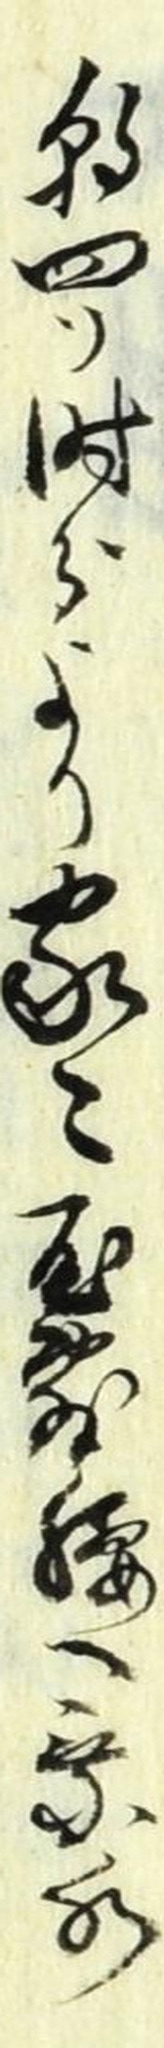朝四ツ時分より家々屋敷腰へ乗水
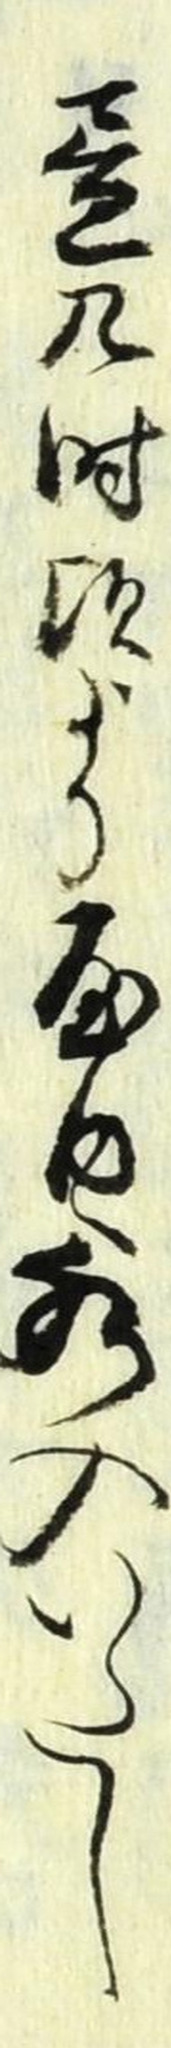昼九時頃より屋内へ水入いたし
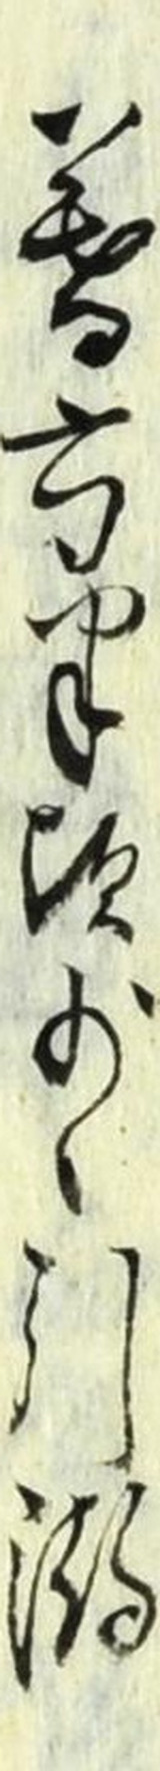暮六ツ半頃少々引潮
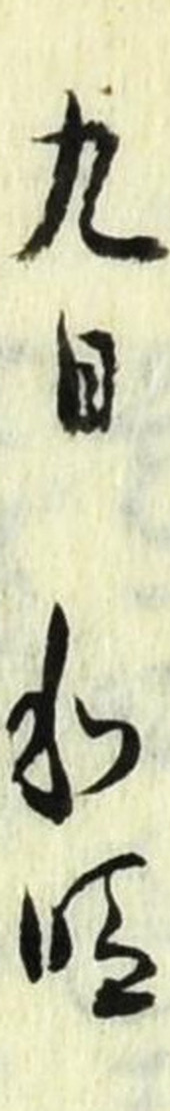九日和晴
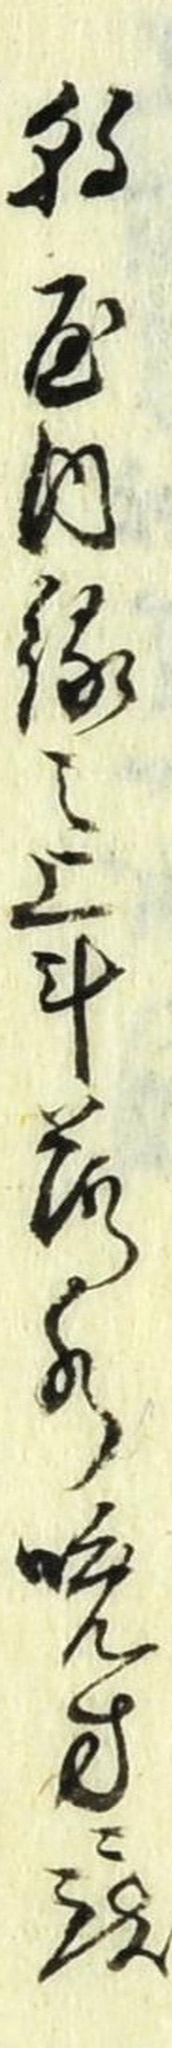朝屋内縁之上計落水暁方に致
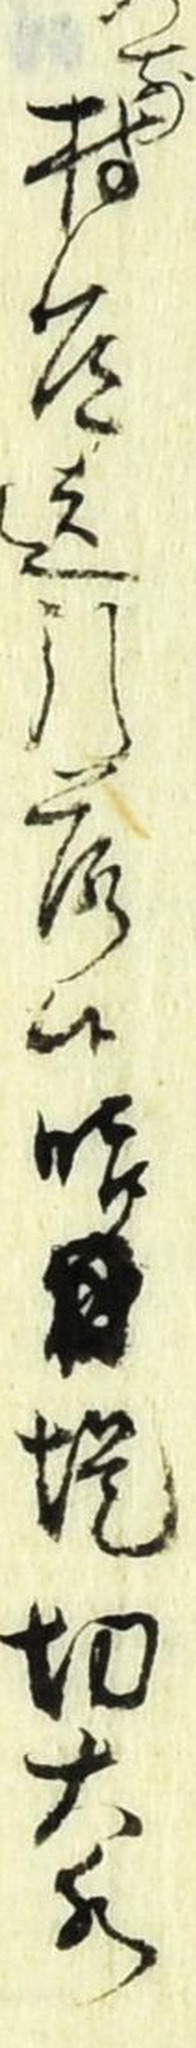門前村道迄引落候昨日堤切大水
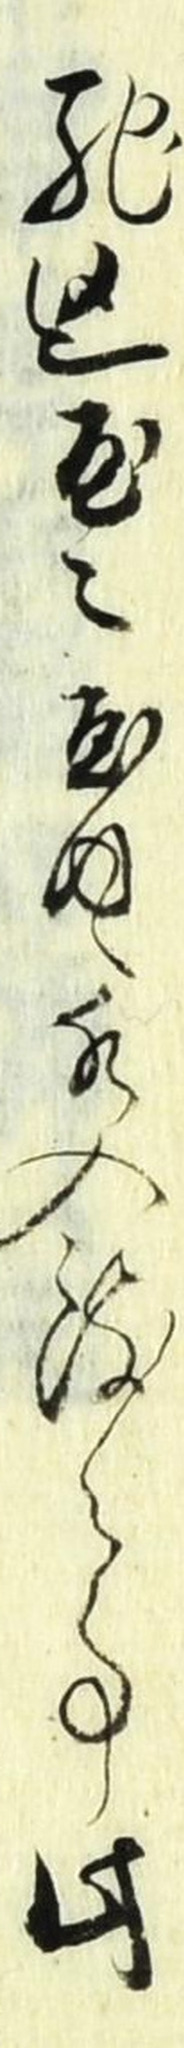馳込屋々屋内へ水入致之事此
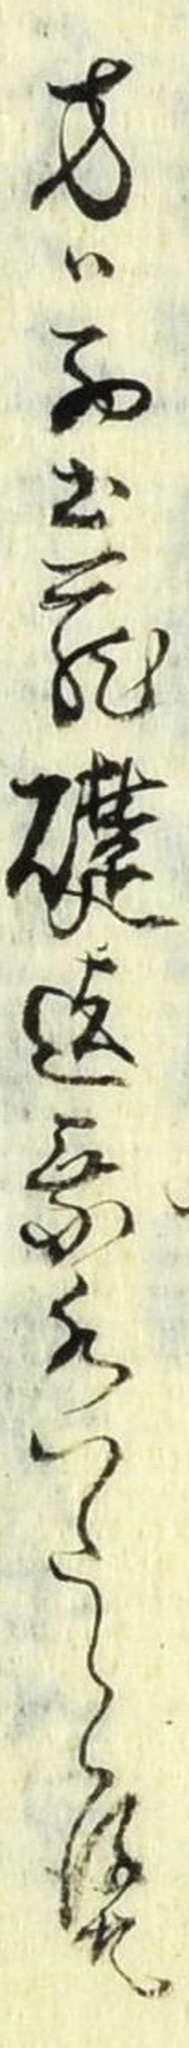方は西土蔵礎迄乗水いたし候得共
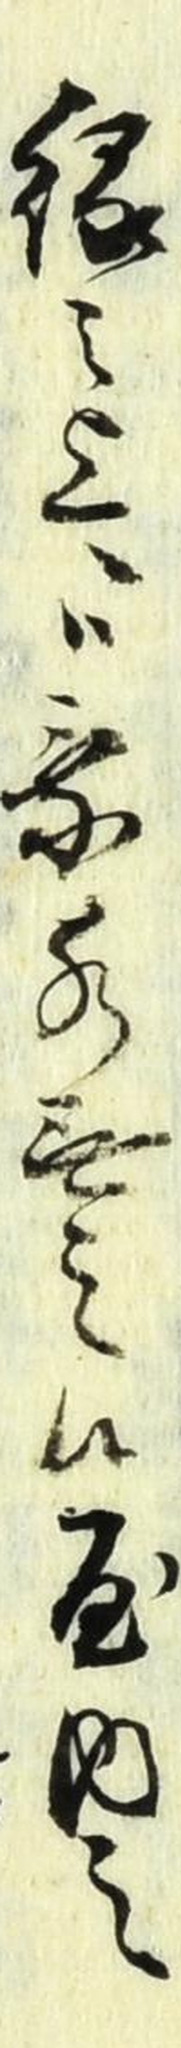縁之上には乗水無之候屋内之
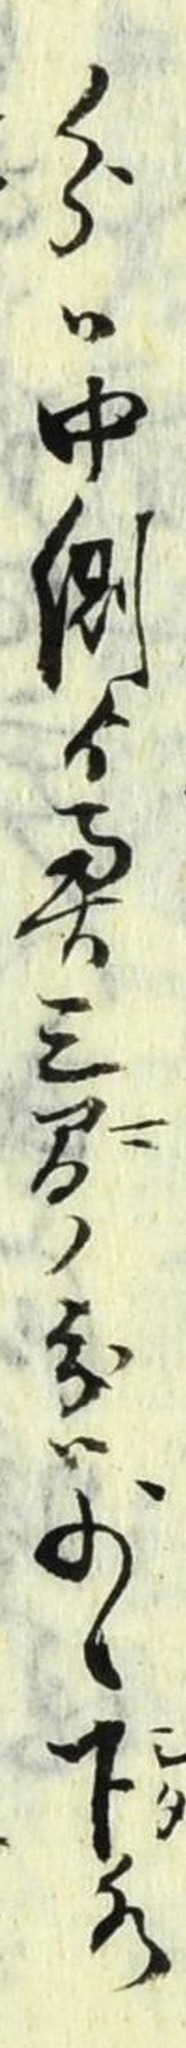分は中側ゟ奥三間の分は少々下水
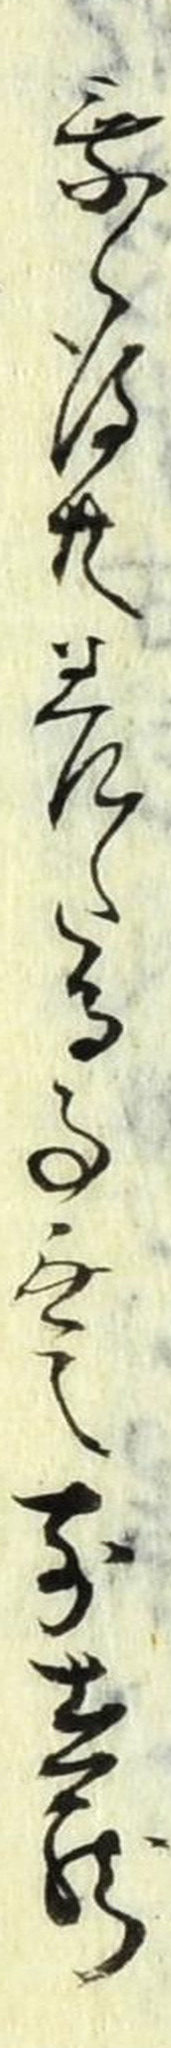乗候得共差たる事無之前土蔵
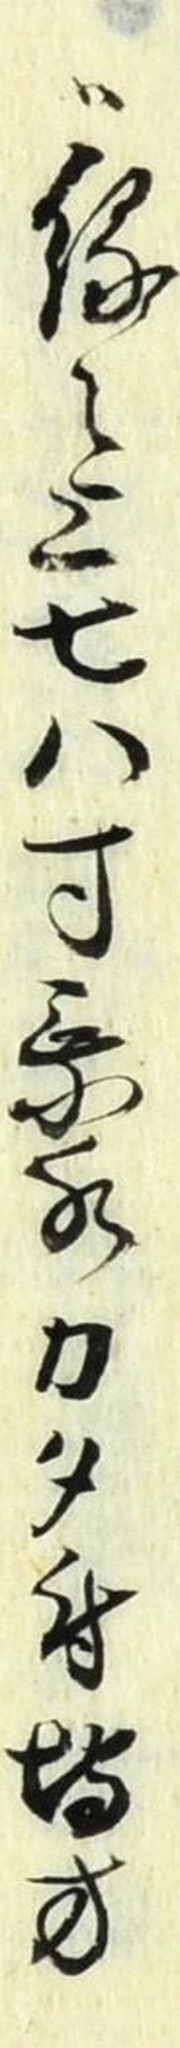は縁之上七八寸乗水カタ付埒方
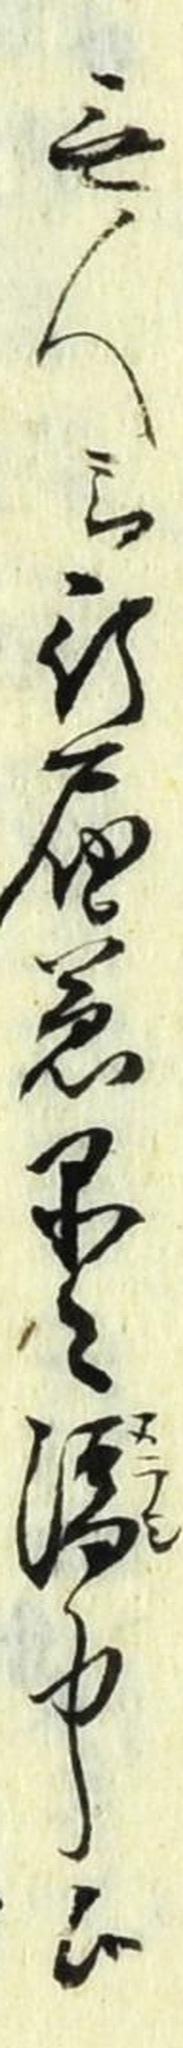無人に而行届兼早品々濡申候
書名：（日記）
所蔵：福井県文書館 Fukui Prefectural Archives
